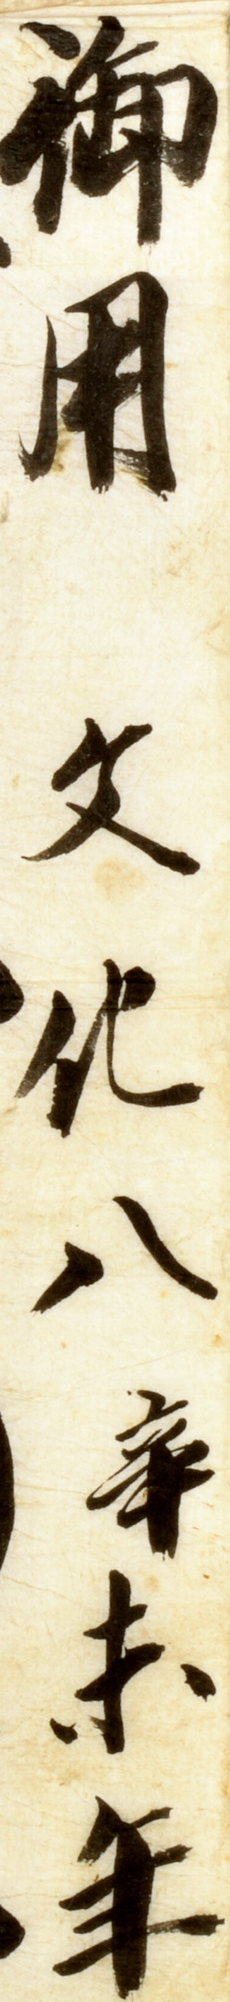御用文化八辛未年
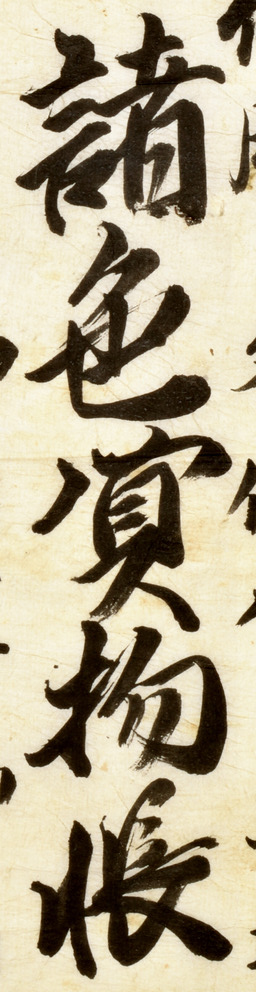諸色買物帳
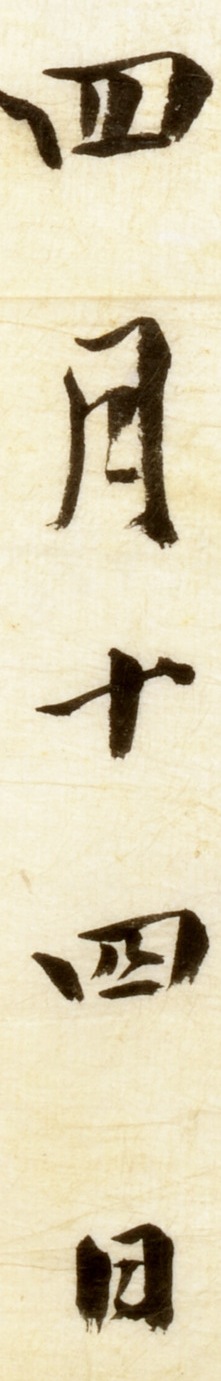四月十四日

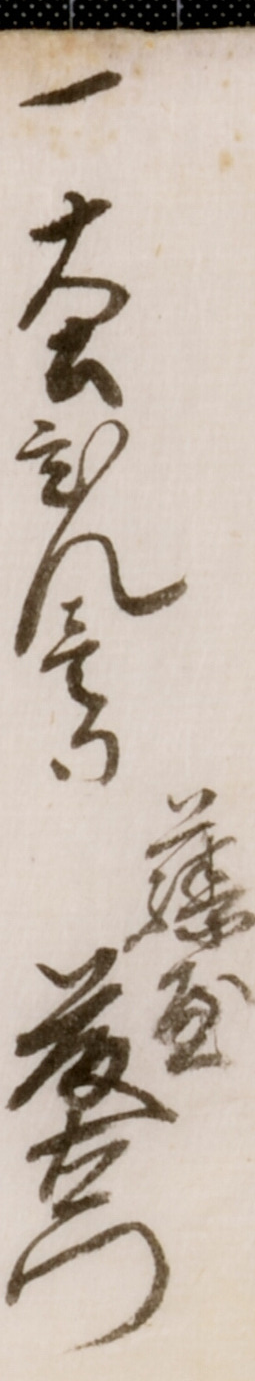一大土ひん壱ツ藤左衛門
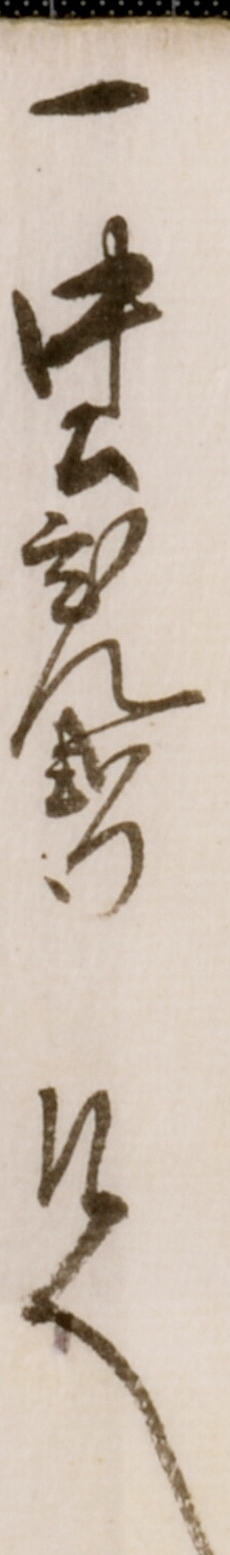一中土ひん弐ツ同人
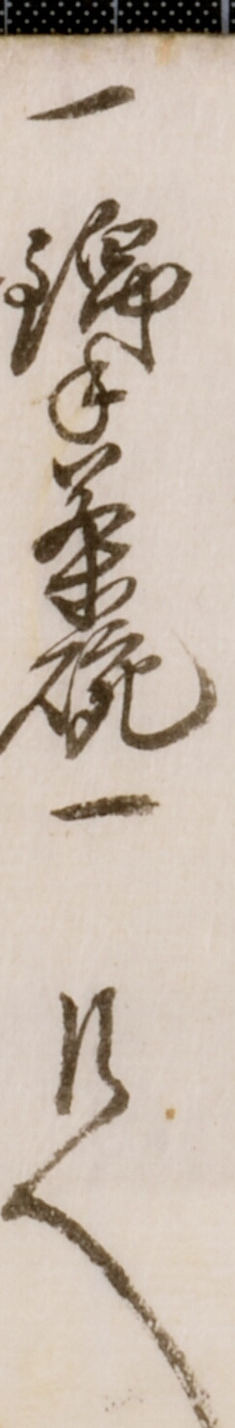一錦手茶碗一同人
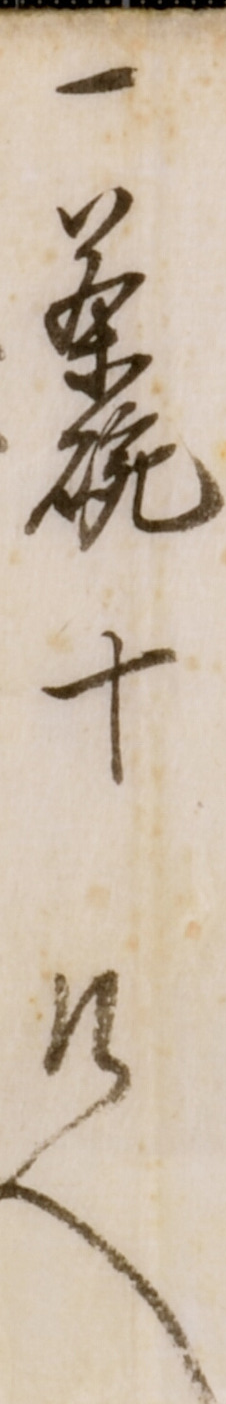一茶碗十同人
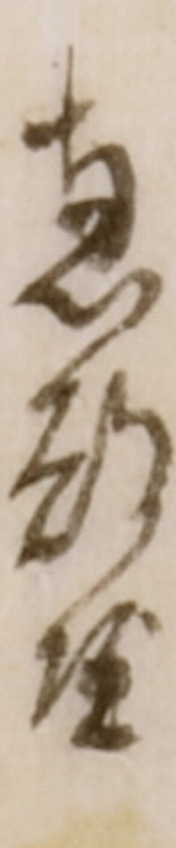恵都屋
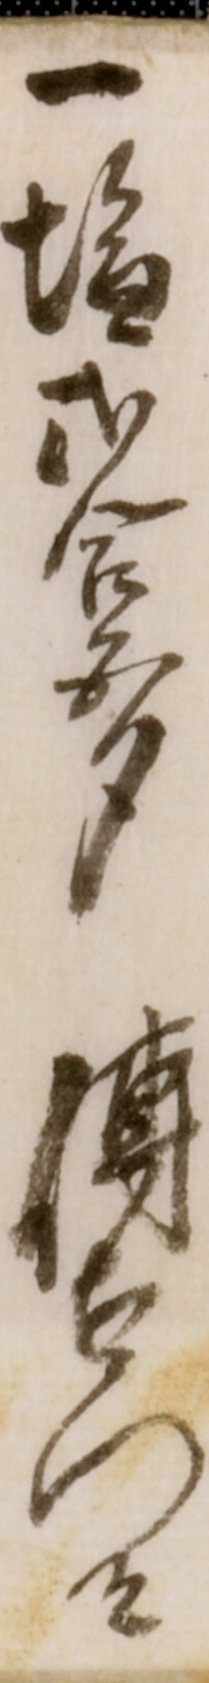一塩弐合五尺伝右衛門江
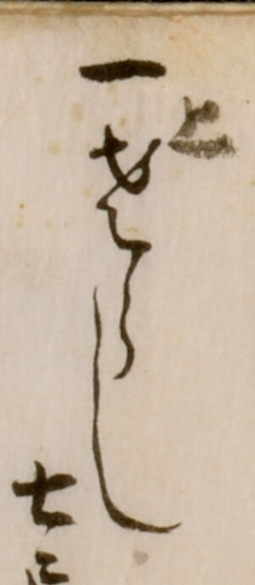一さらし同人

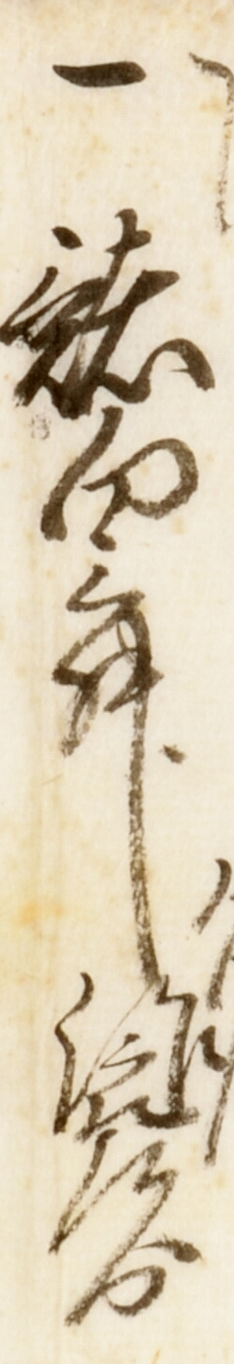一諸向三升治良左衛門
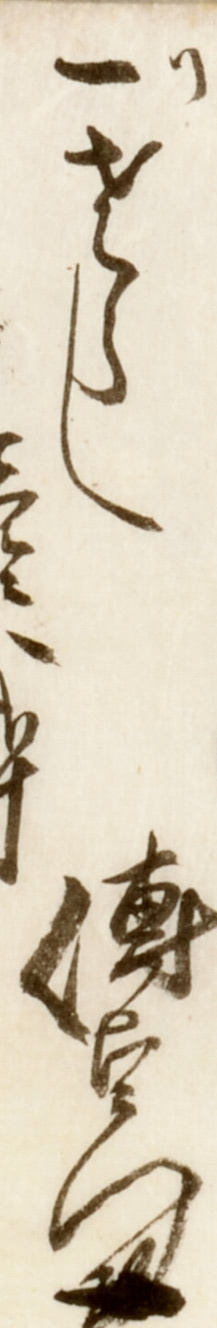一さらし伝右衛門
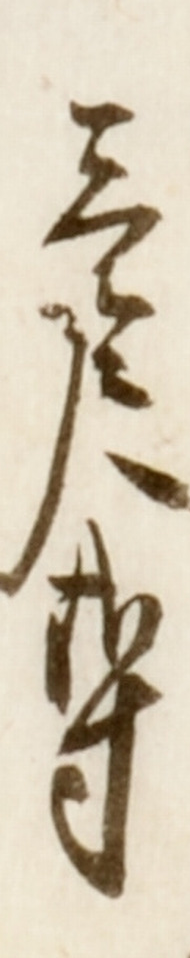壱尺弐寸
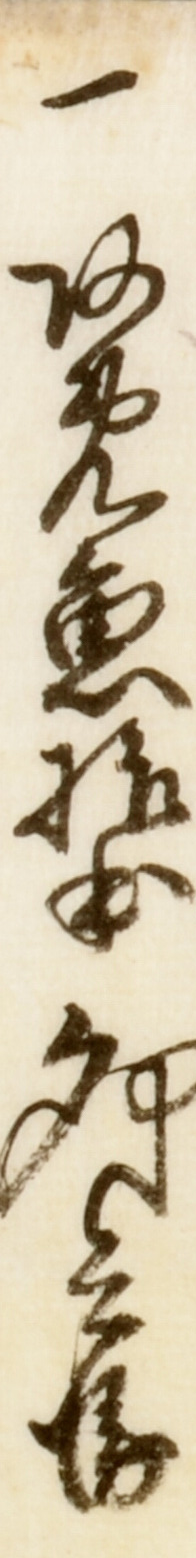一阿免魚拾本卯兵衛
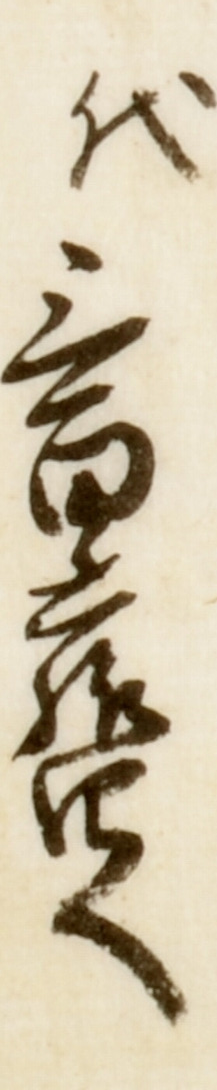代三百六拾四文

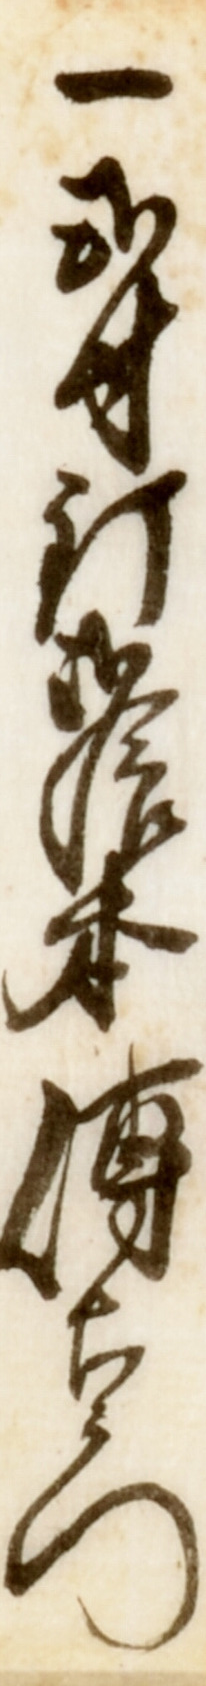一弐寸釘弐拾本伝右衛門
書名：御用諸色買物帳
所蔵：伊那市立高遠町図書館・合同会社AMANE
